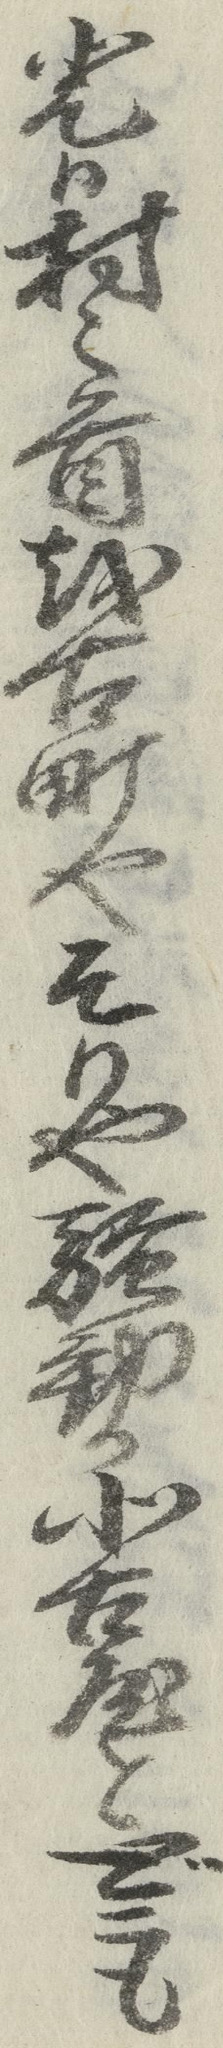登る村々首を古町やそりや騒動か北古屋とどこも
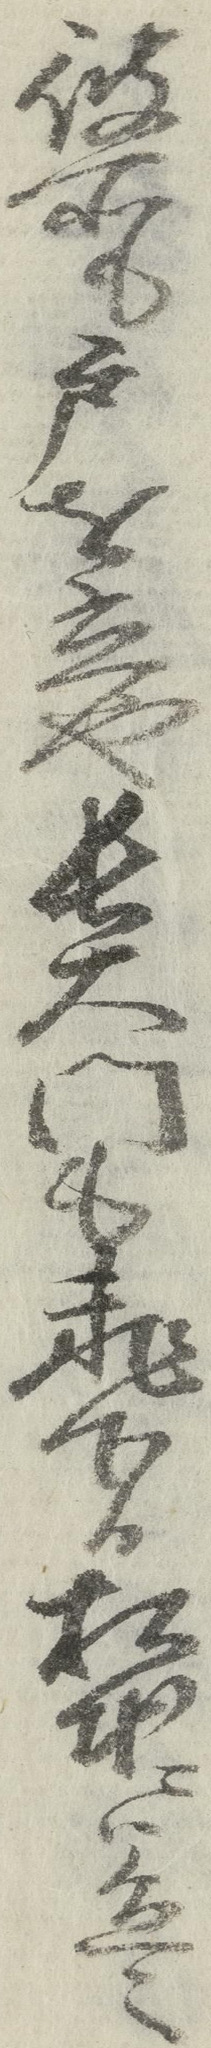彼所も戸を立や長大門も飛下る松本には色〻
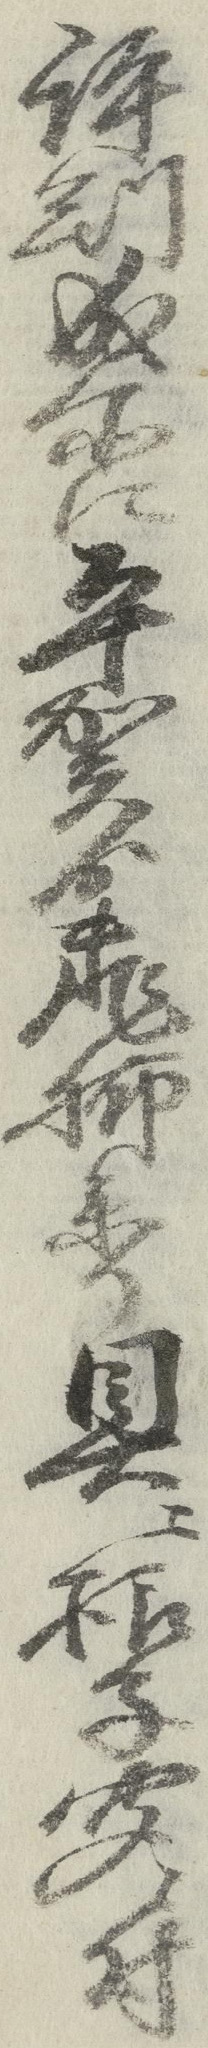評判成所に平賀ゟ飛脚来り具に様子聞に付
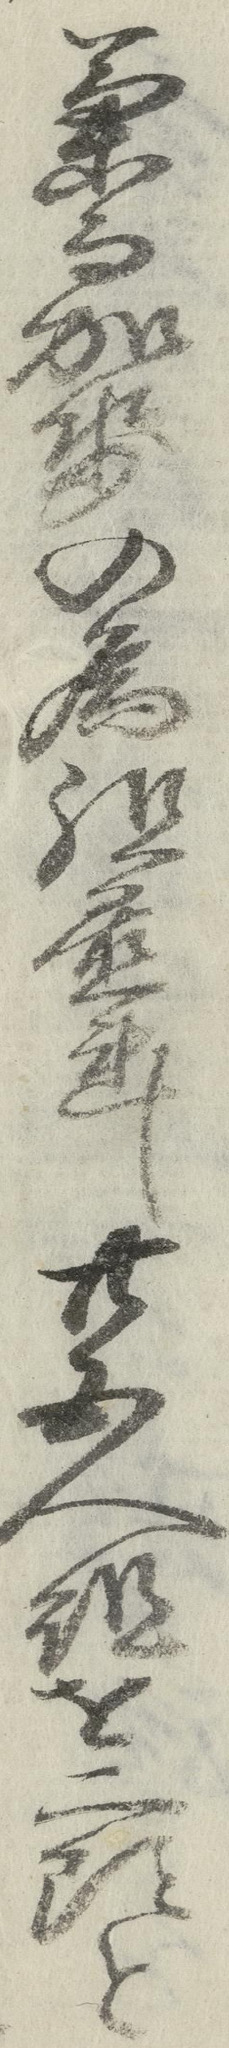兼而加勢の為組置れし廿五人組を二頭と
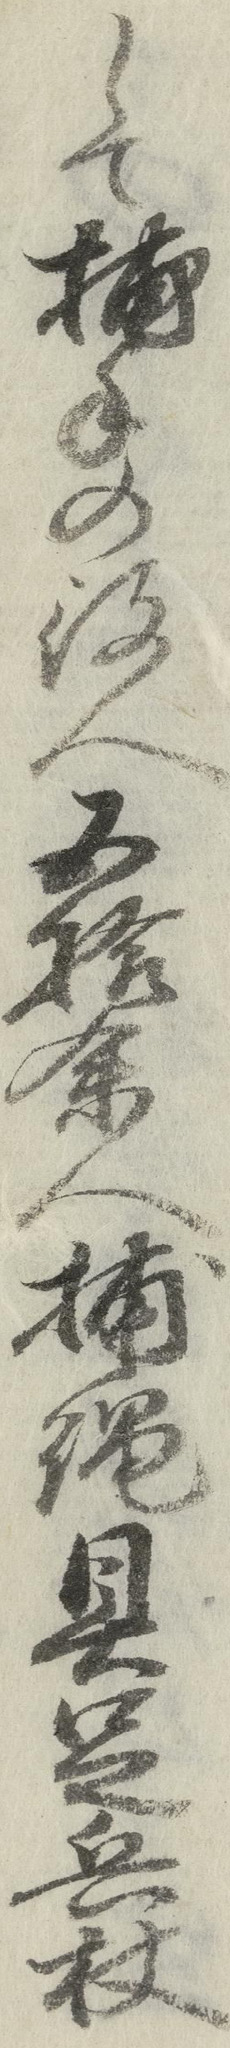して捕手の役人五拾余人捕縄具足兵杖
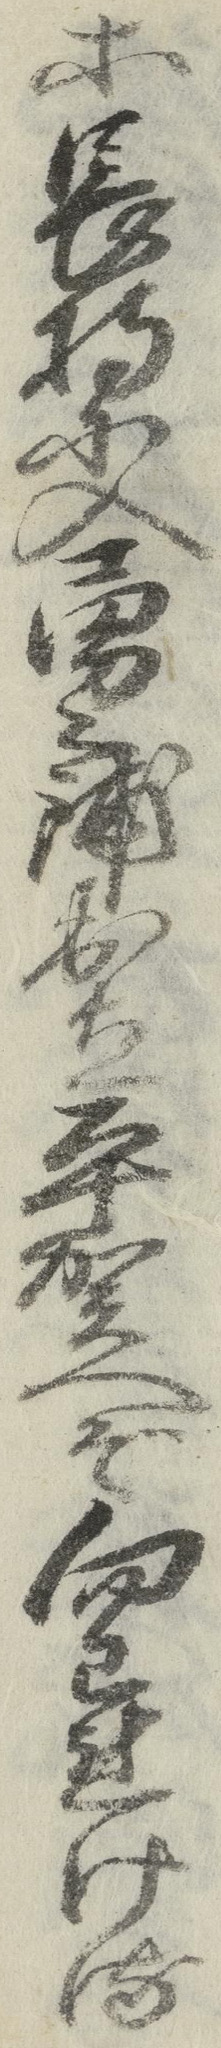等長持に入勇々鋪出立平賀へぞ向われける

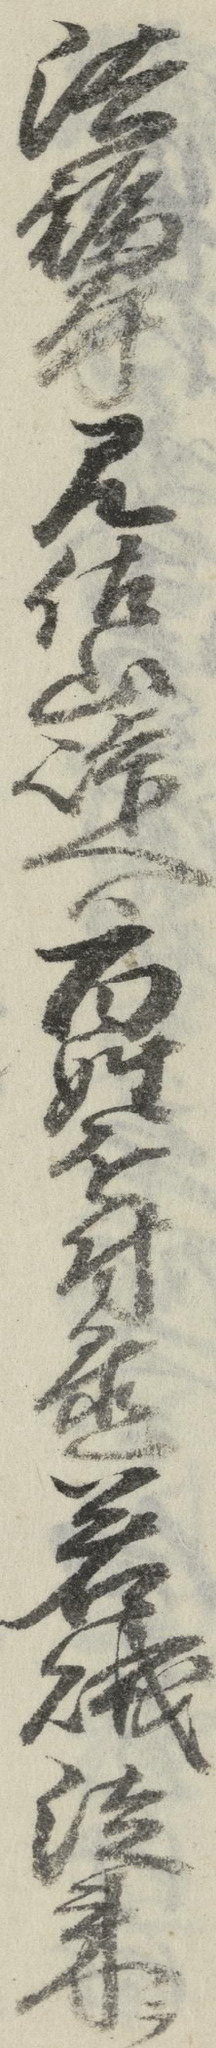法福寺見佐山峠へは百姓を付置若賊徒来
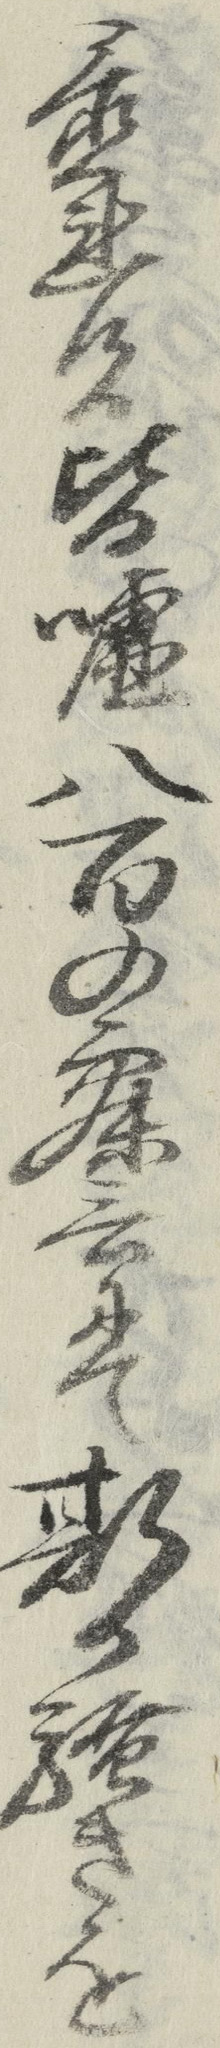置れける皆嘘八百の寐言にて斯る騒きを
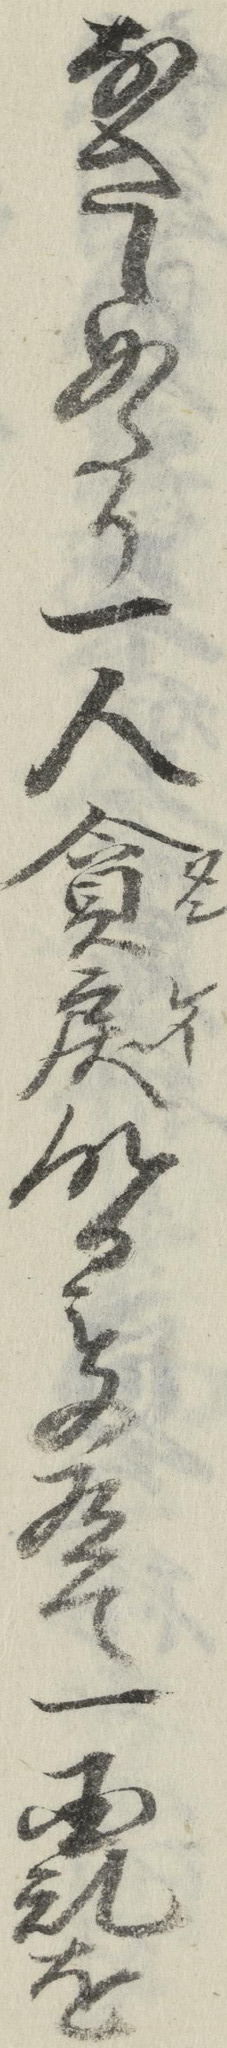なさしめたり一人貪戻なるもの有て一国乱を
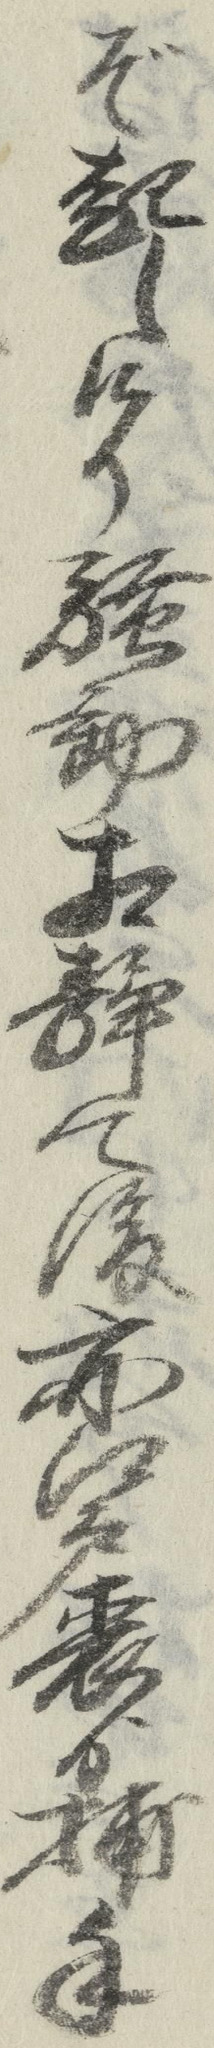ぞ起しけり騒動相静て後亦江戸表ゟ捕手
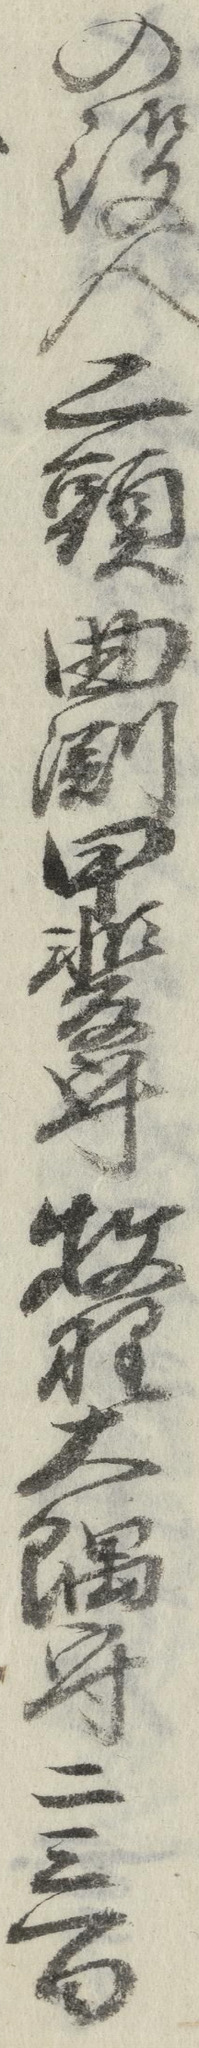の役人二頭曲渕甲斐守牧野大隅守二三百
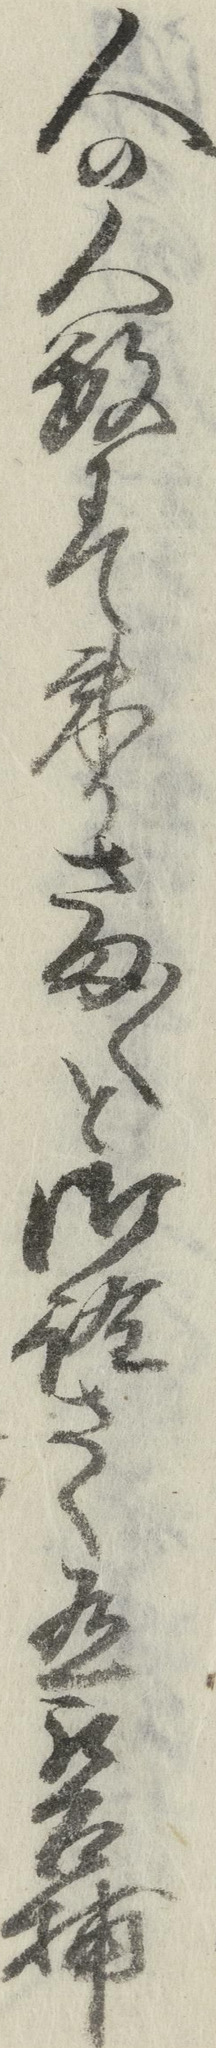人の人数にて来りさま〳〵と御詮さく有被召捕
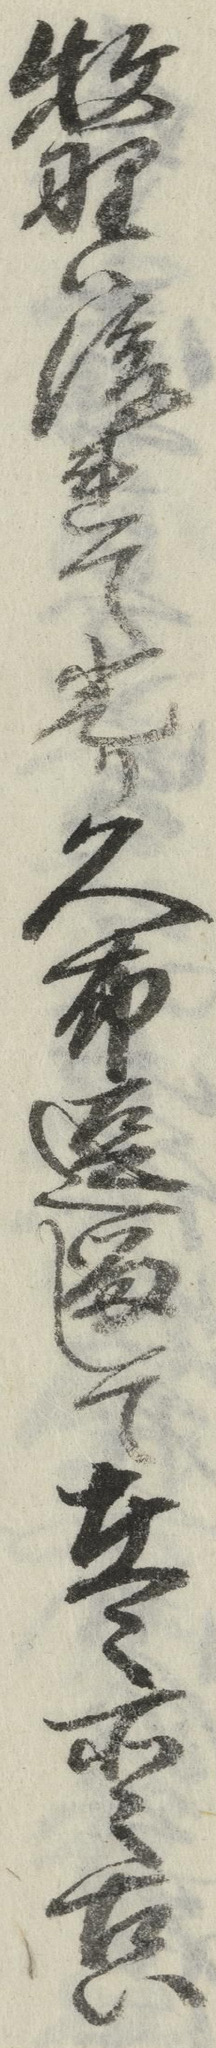牧野は後れて登り久布逗留して在々所々古い
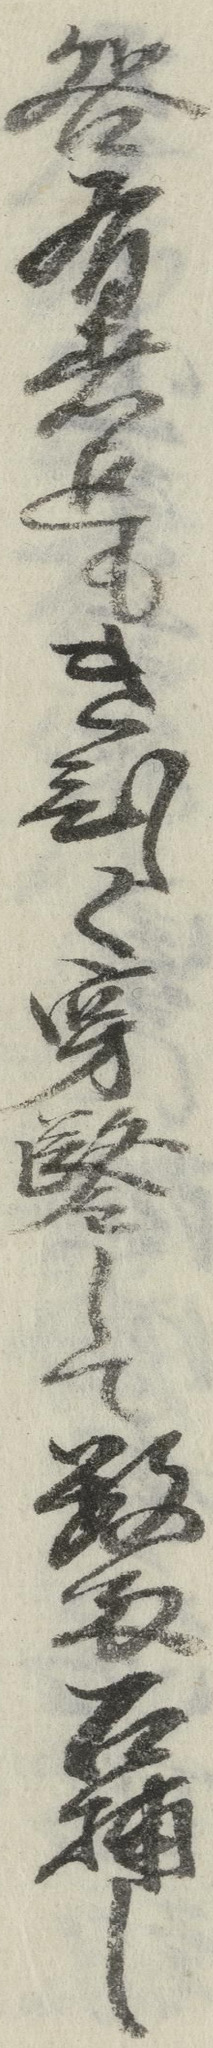咎有者迄もきひしく穿鑿して数多召捕し
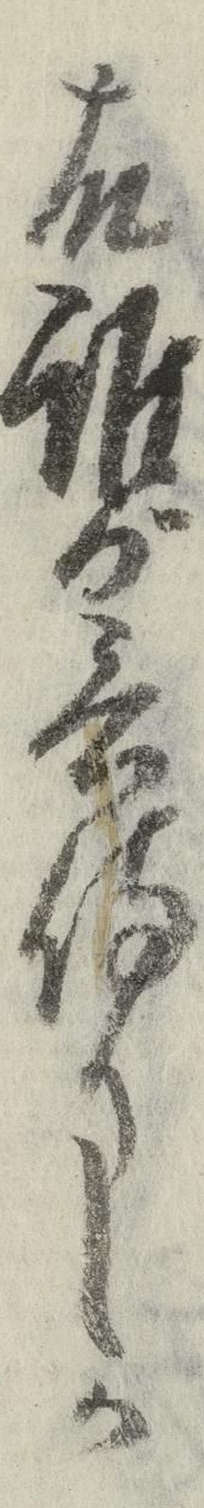故誰か言侍りしか
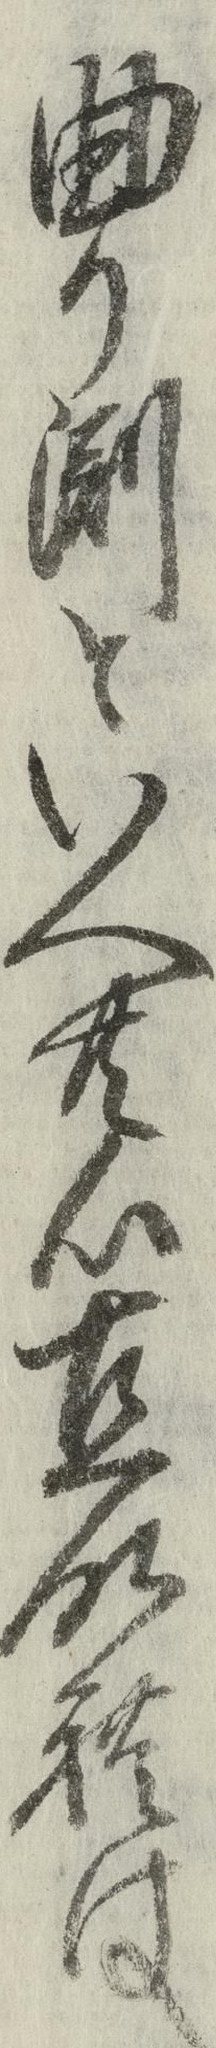曲り渕といへ共心直なれは
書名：浅間大焼騒動記　下
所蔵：東京大学地震研究所図書室 Earthquake Research Institute Library, The University of Tokyo, JAPAN
